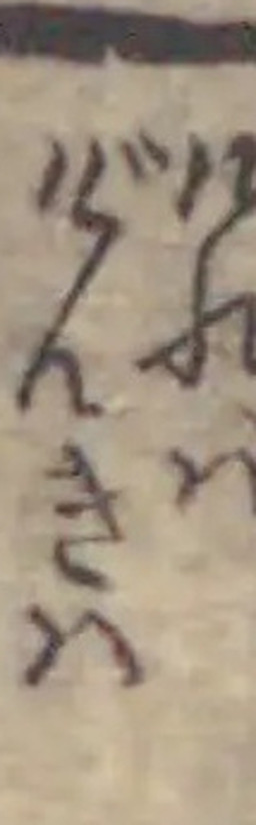げんきは
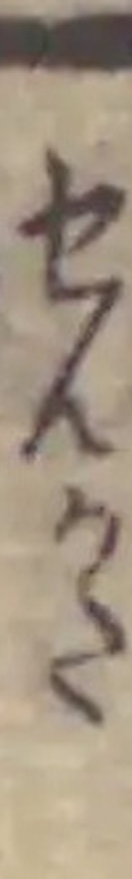せんかた
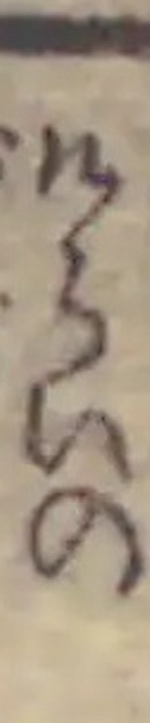けらいの
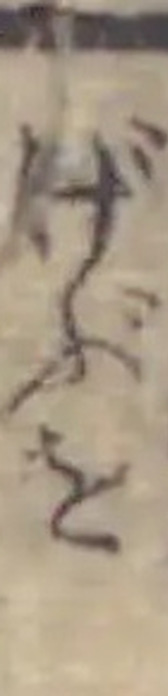げぶを
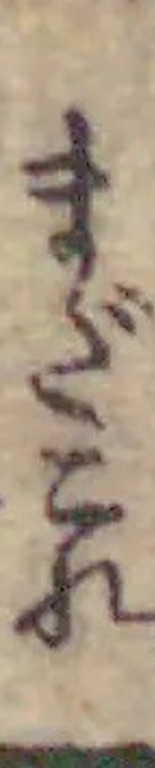まだこれ
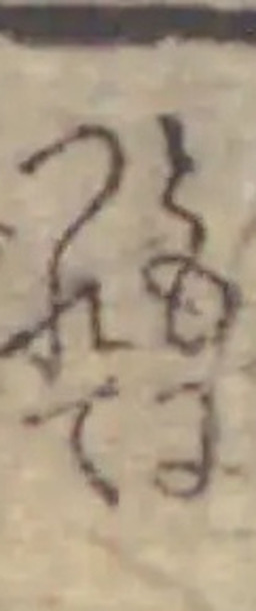つれて
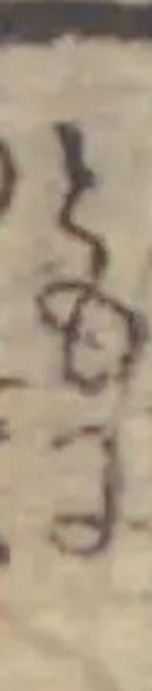ともに
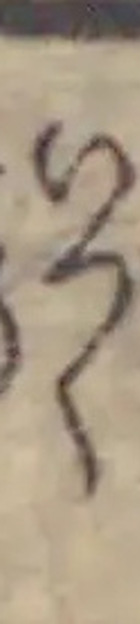いづく
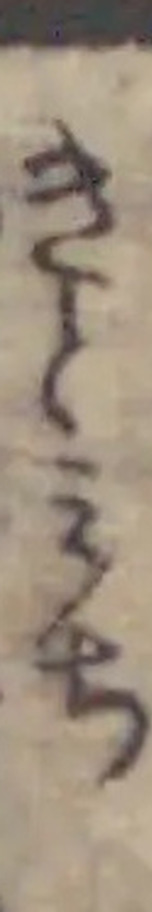きとみち
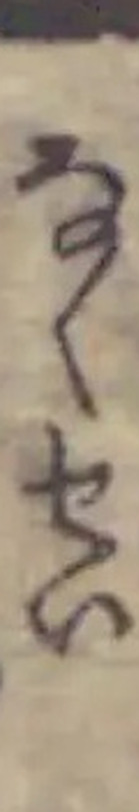なくせい
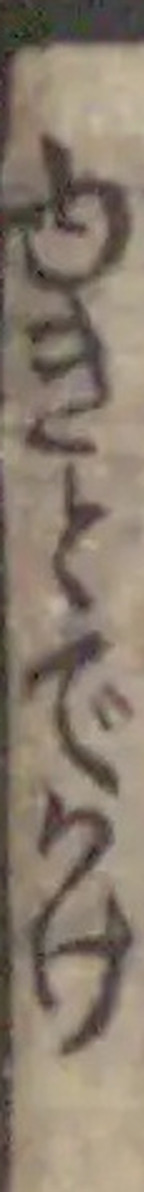ゆきとでかけ
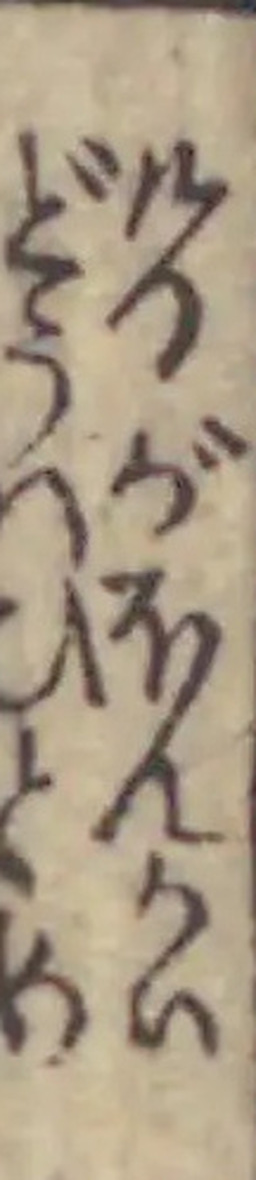どうはひとめ
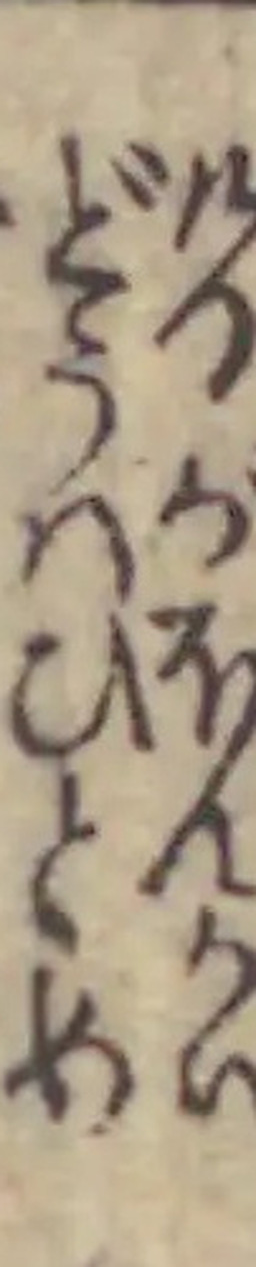どうはひとめ
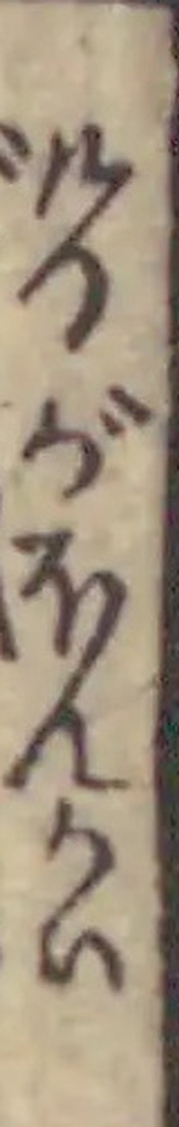けるがほんかい
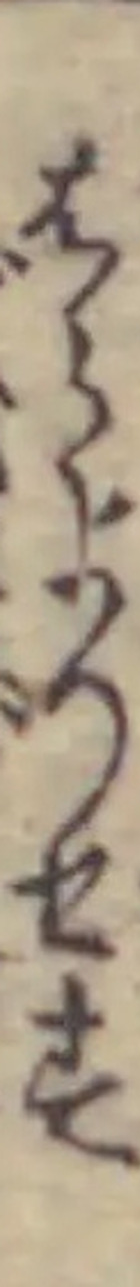はらよりせす
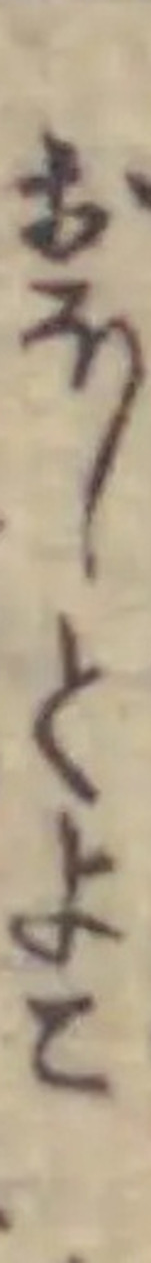おほしとよこ
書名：腹内養生主論 3巻
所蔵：国立国会図書館 National Diet Library, JAPAN
